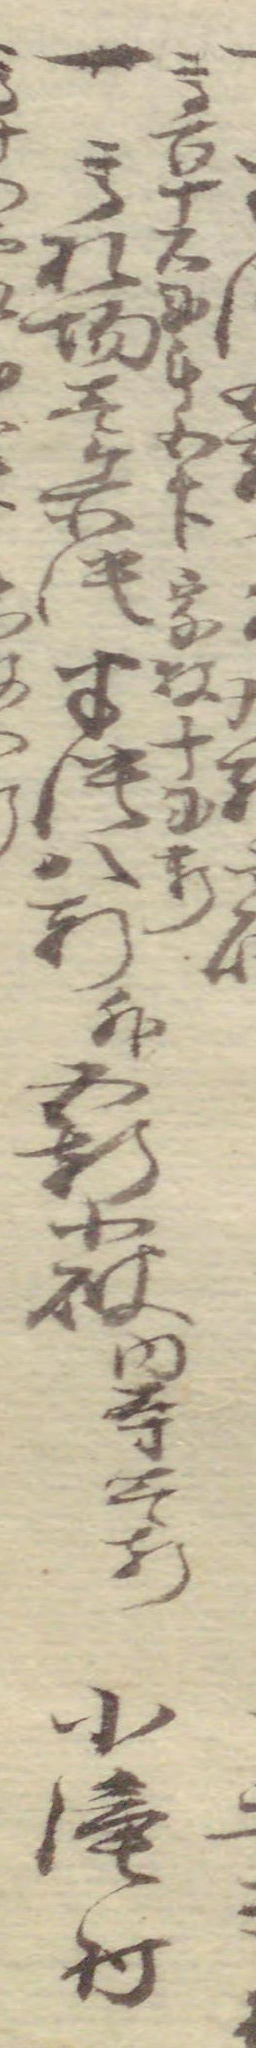一高札場壱ケ所潰半潰八軒外五軒小破内寺壱軒小滝村
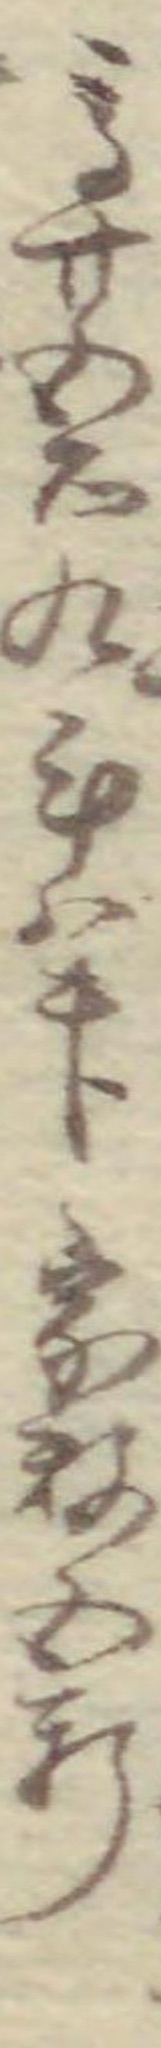高廿五石九斗八升家数五軒
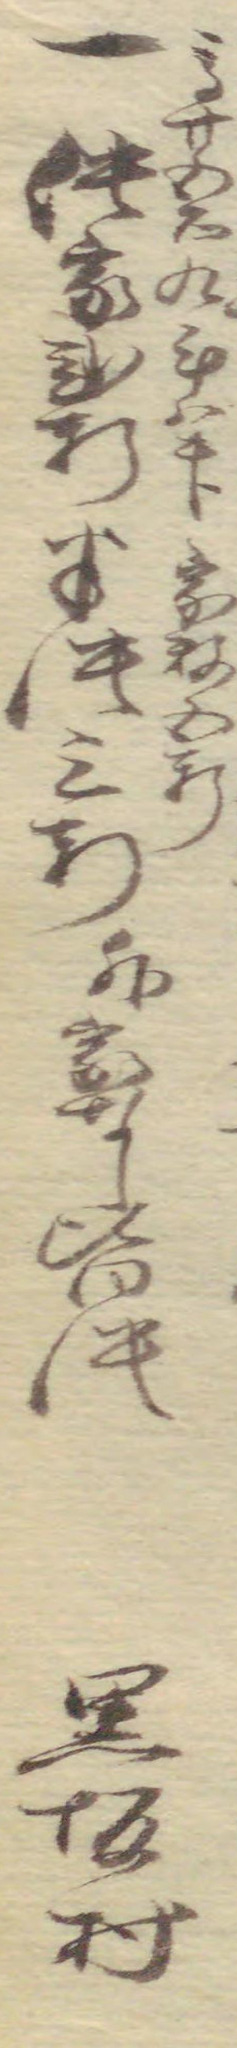一潰家弐軒半潰三軒外家なし皆潰黒坂村

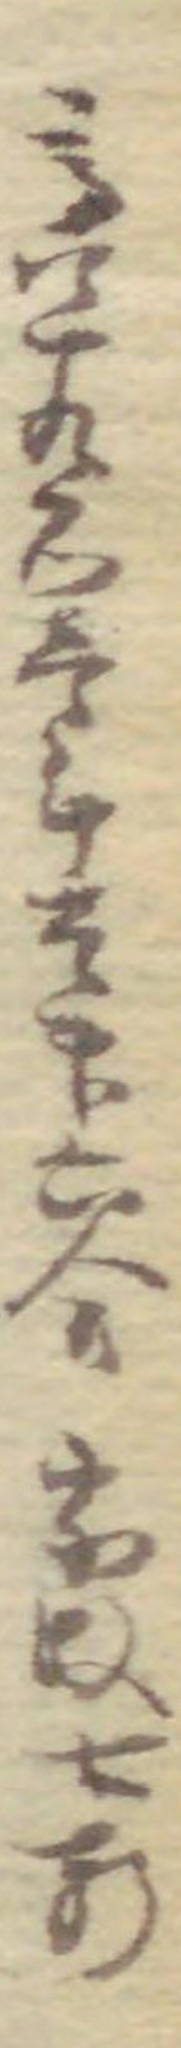高四十九石壱斗壱升六合家数七軒
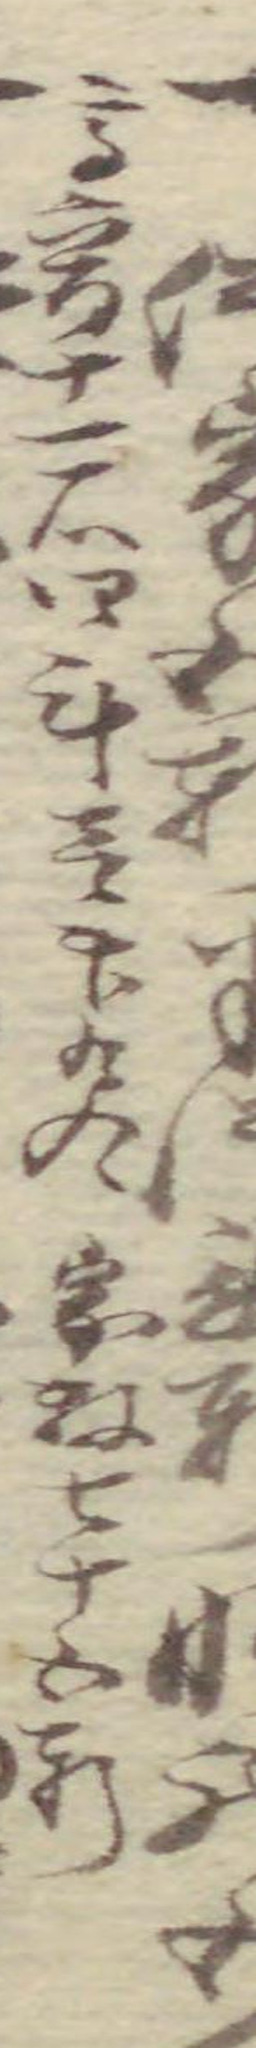高六百十一石四斗壱升九合家数七十五軒
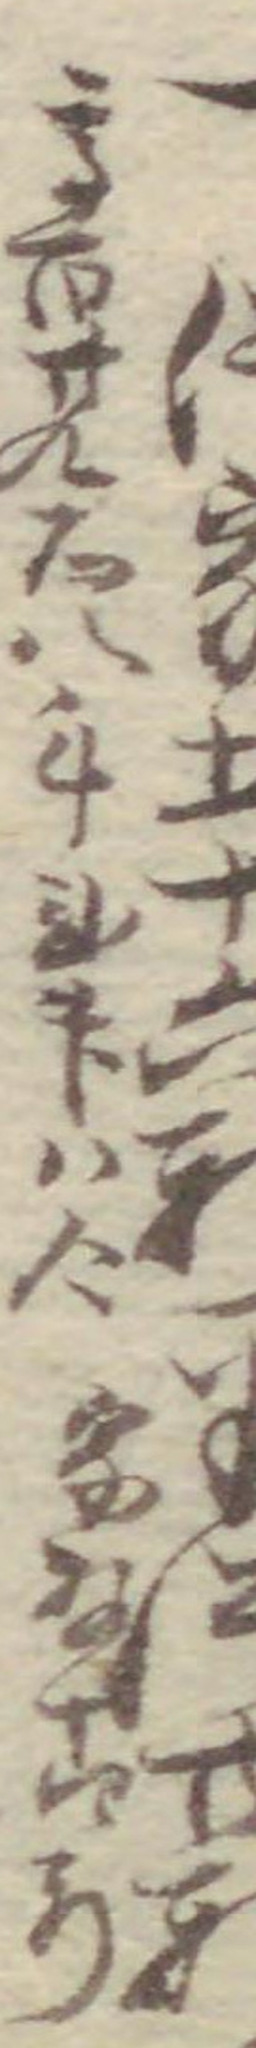高百廿九石八斗弐升八合家数十四軒
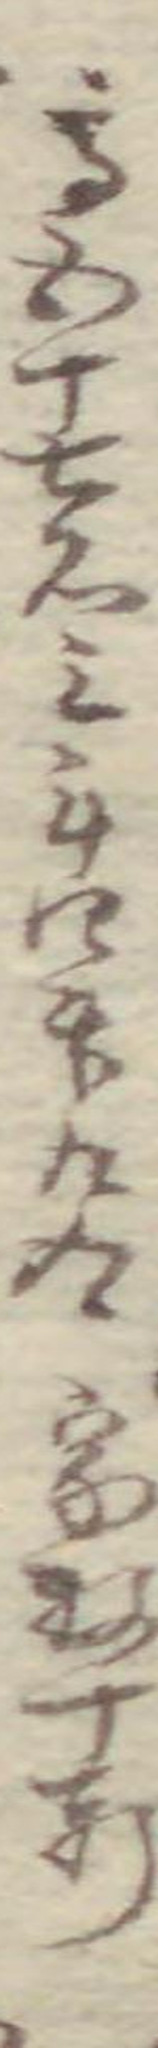高五十七石三斗四升九合家数十軒
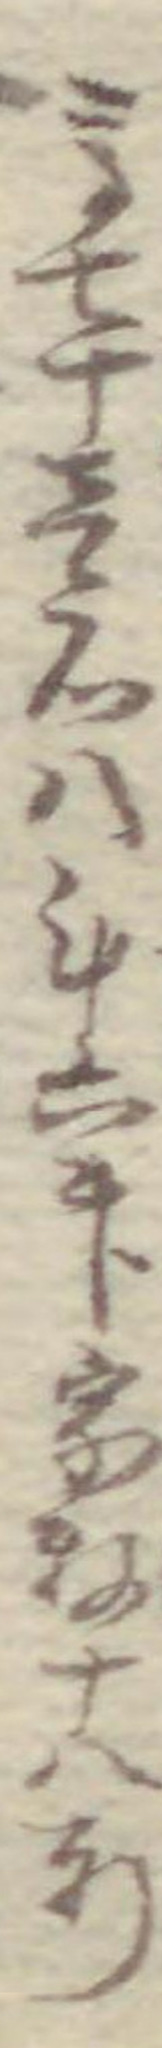高七十壱石八斗六升家数十八軒
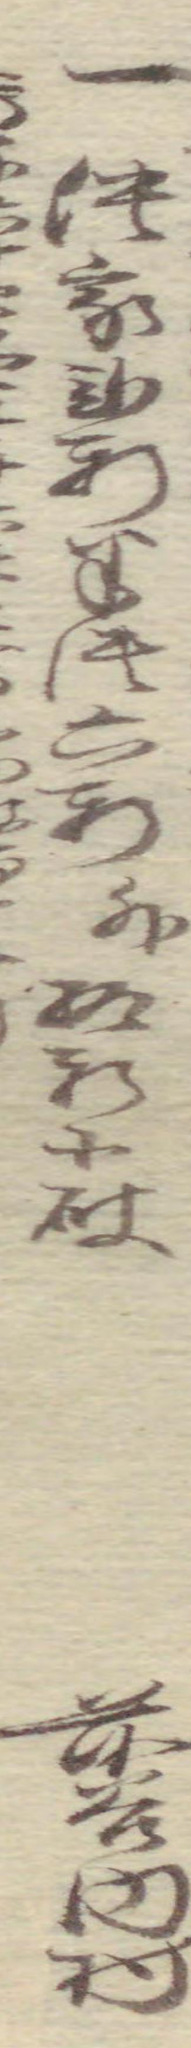一潰家弐軒半潰六軒外拾軒小破前谷内村
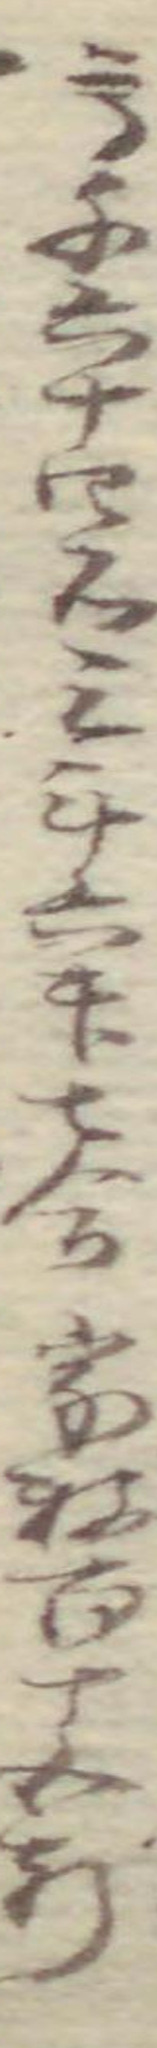高千六十四石三斗六升七合家数百十五軒
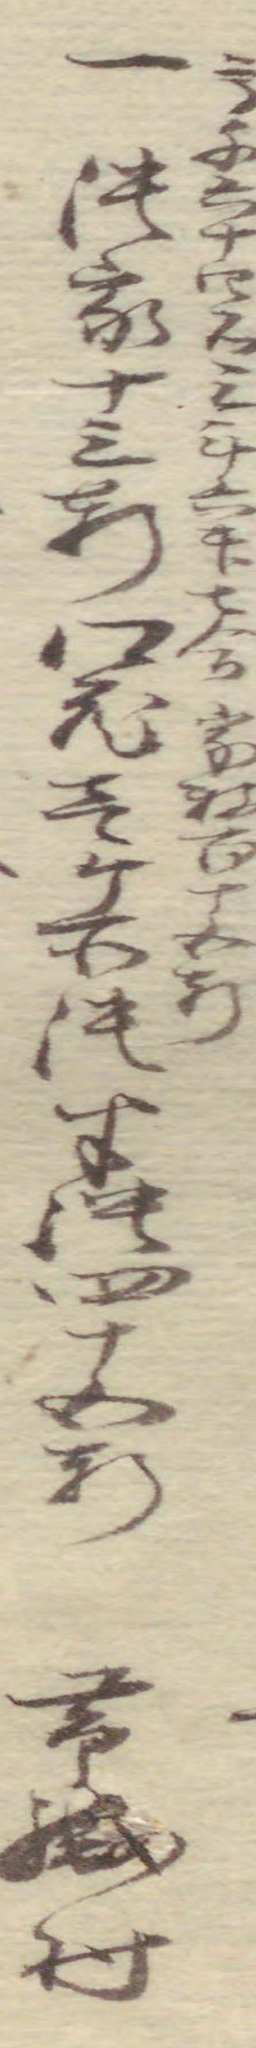一潰家十三軒郷蔵壱ケ所潰半潰四十五軒帯織村
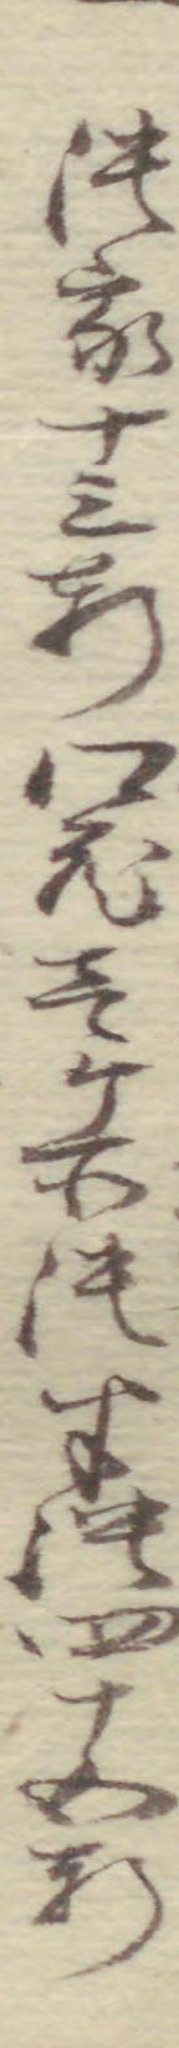一潰家十三軒郷蔵壱ケ所潰半潰四十五軒帯織村
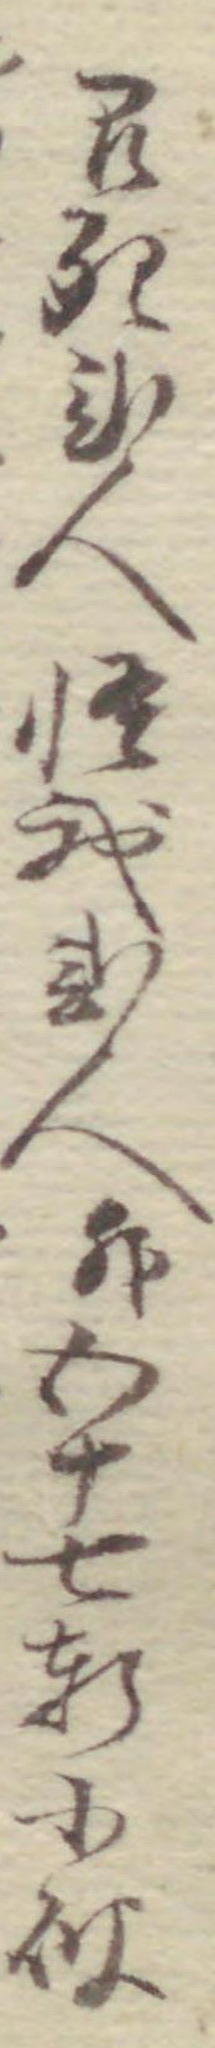即死弐人怪我弐人外五十七軒小破
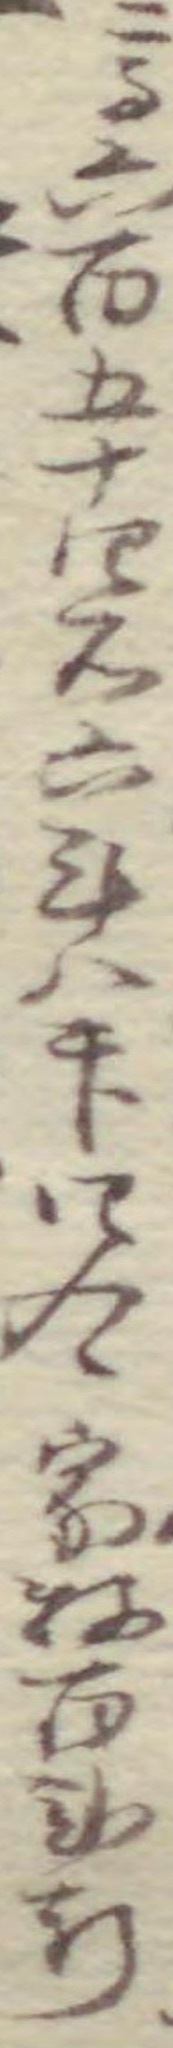高六百五十四石六斗八升四合家数百弐軒
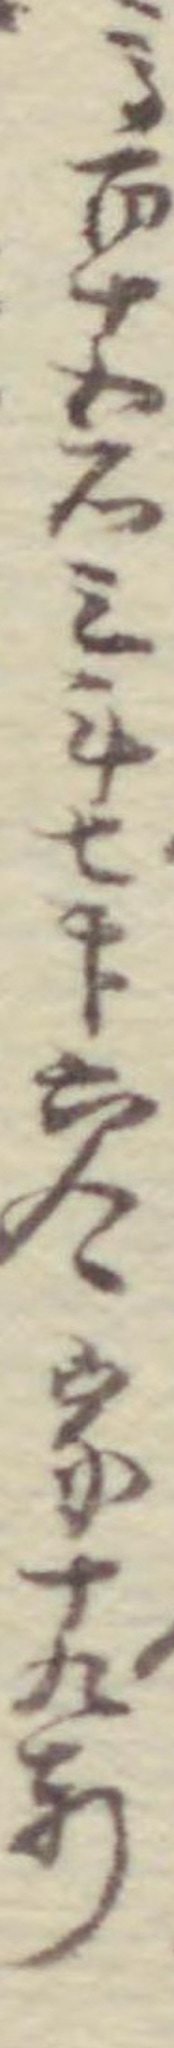高百十五石三斗七升六合家十九軒
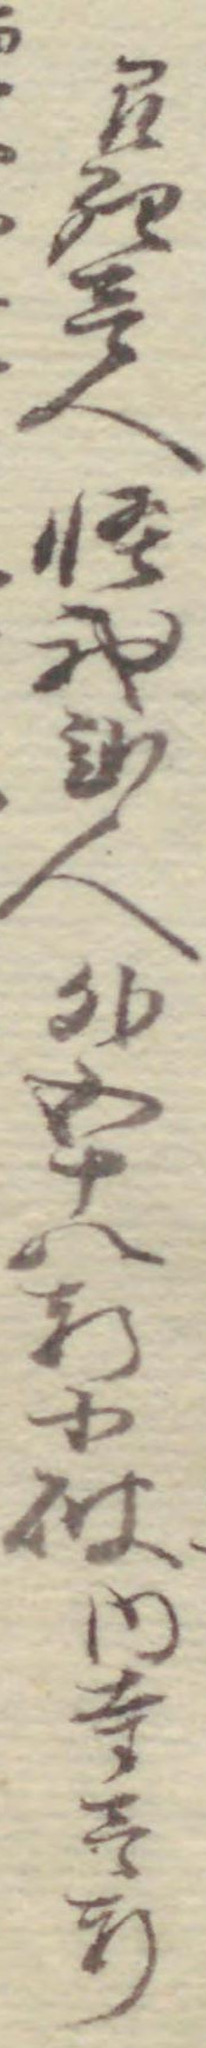即死壱人怪我弐人外五十八軒小破内寺壱軒
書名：鶯宿雑記. 巻199-200
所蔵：国立国会図書館 National Diet Library, JAPAN
